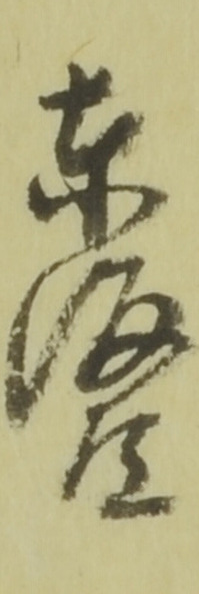東海道
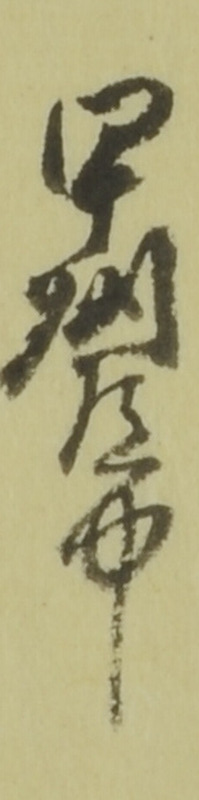甲州道中
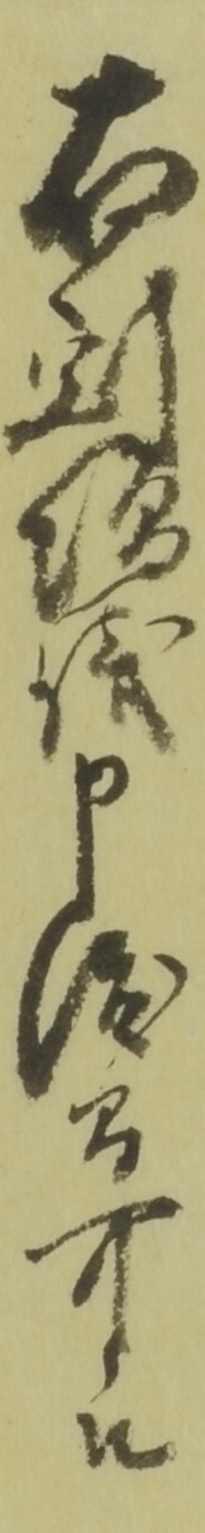右割増銭申渡間可被
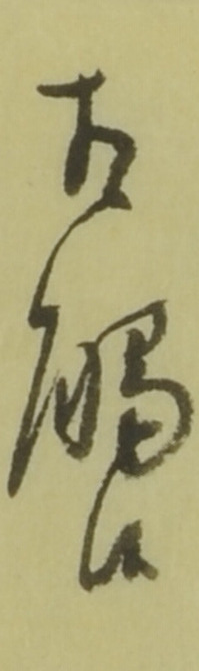相触候
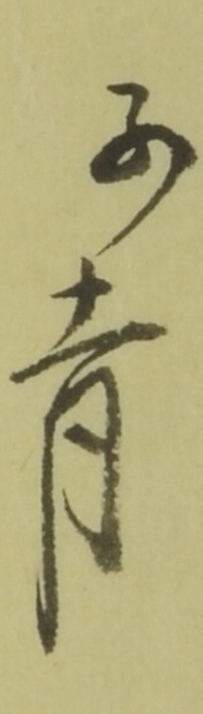子十一月

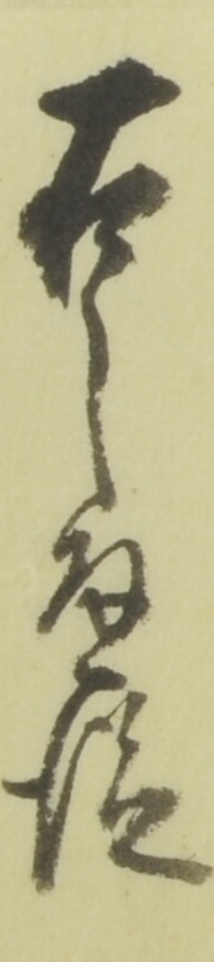右之通従
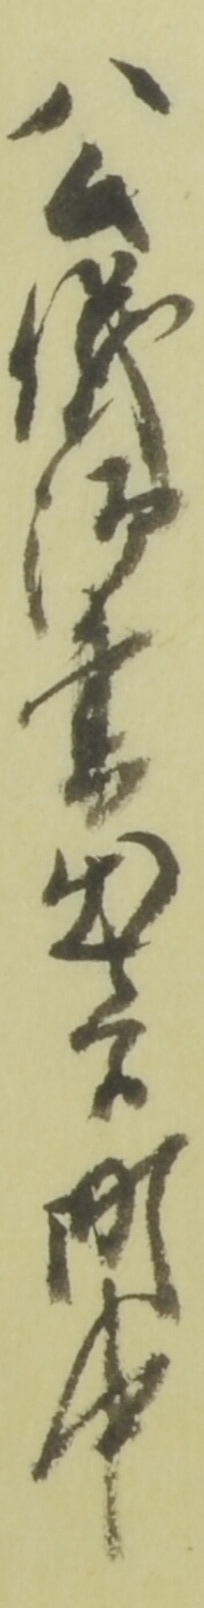公儀御書出候間町中
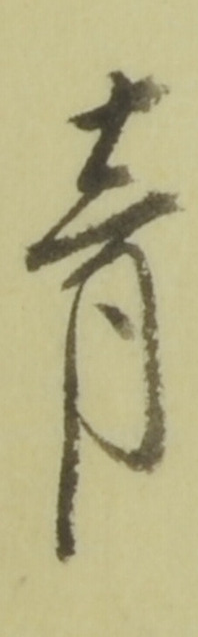十二月
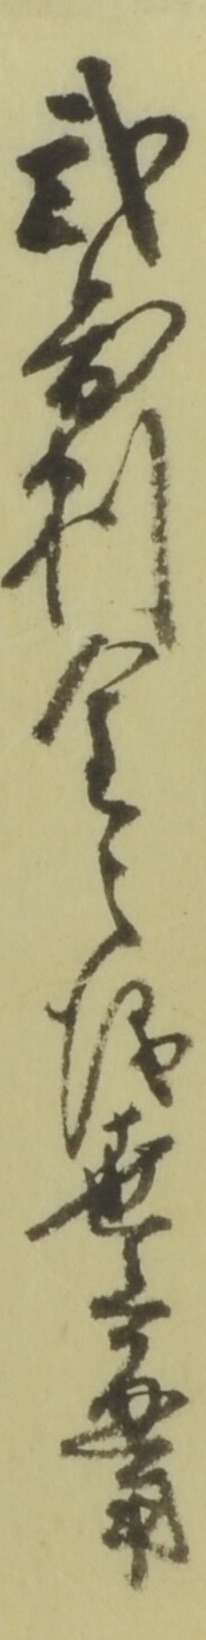弐歩判金之儀世上通用
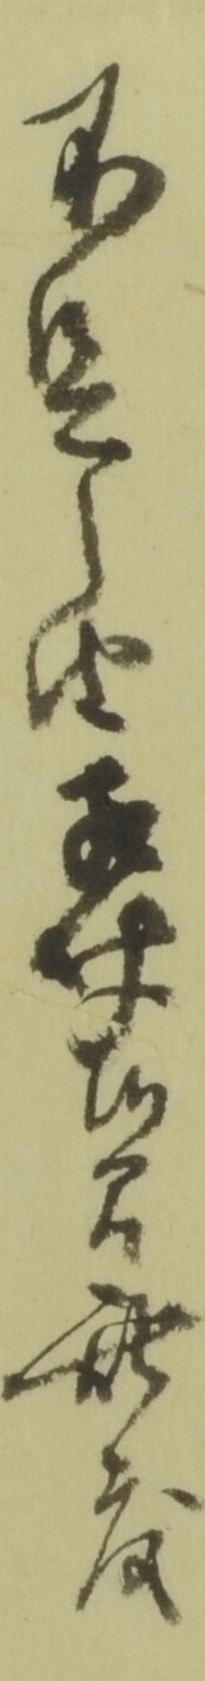不足之由相聞候間此度
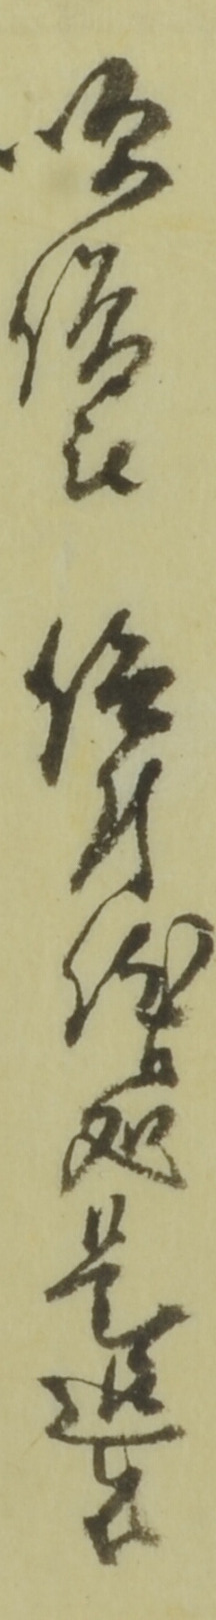吹増被仰付然ル処是迄は
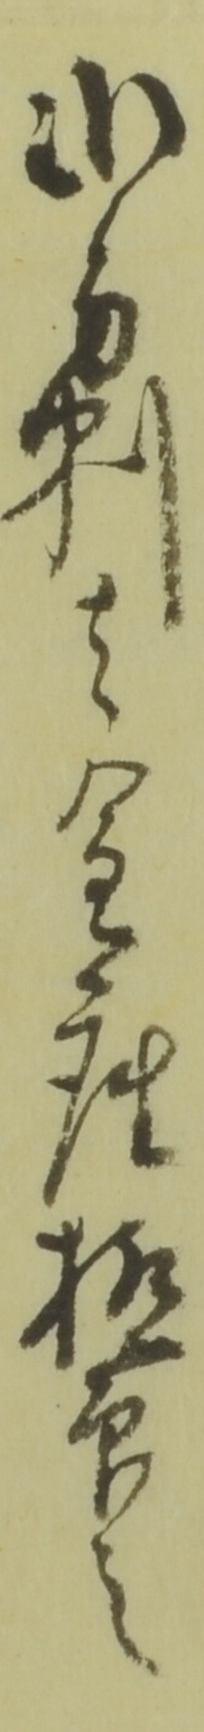弐分判は金座極印之
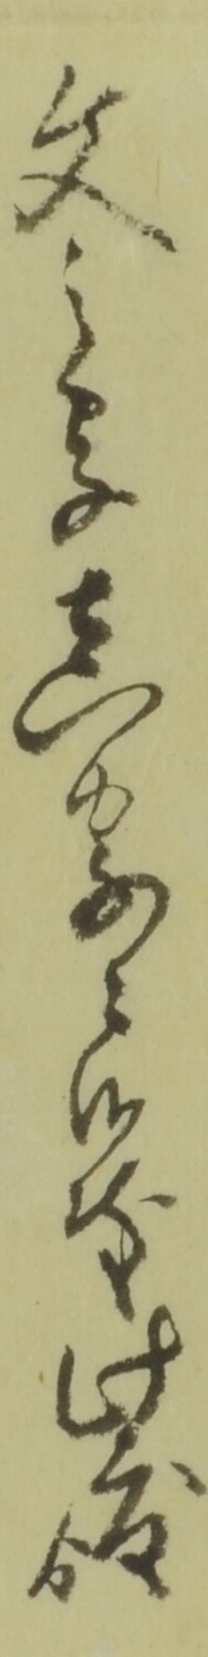文之字真字ニ候処此度ゟ
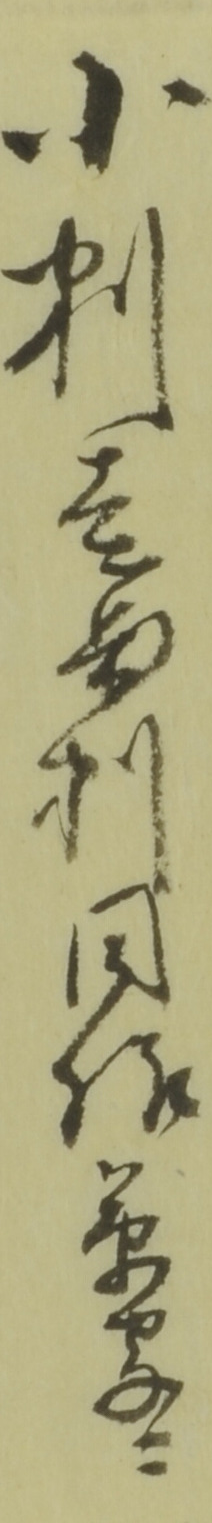小伴壱歩判同様草字ニ
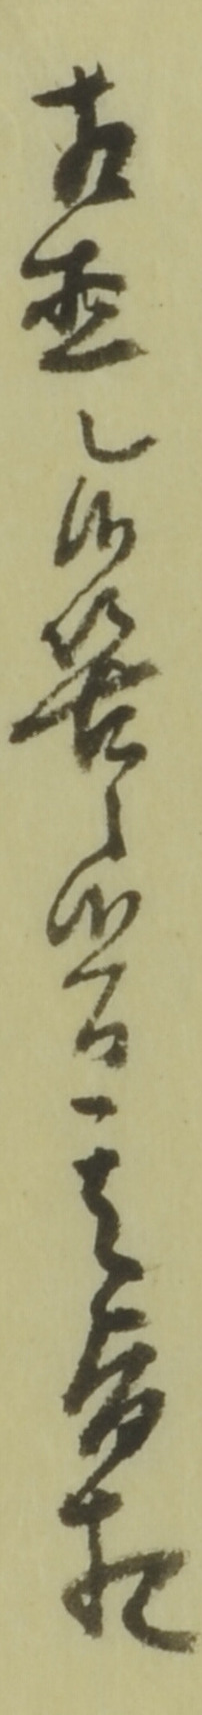相直シ候筈之候間其旨相
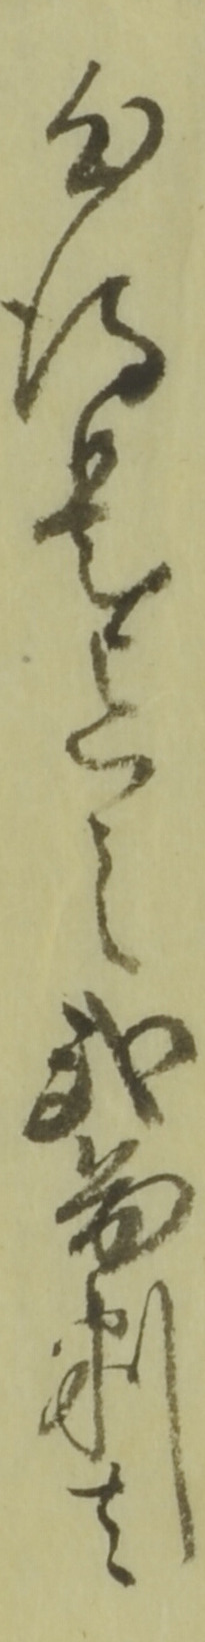心得是迄之弐歩判は
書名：御触書御書附控
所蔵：伊那市立高遠町図書館・合同会社AMANE
